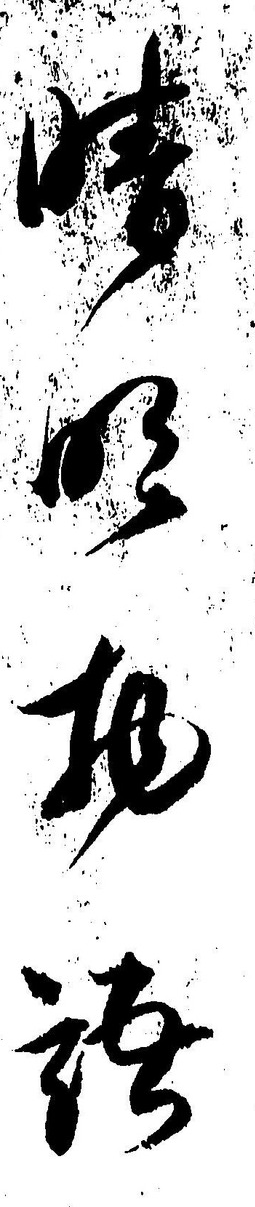清明物語

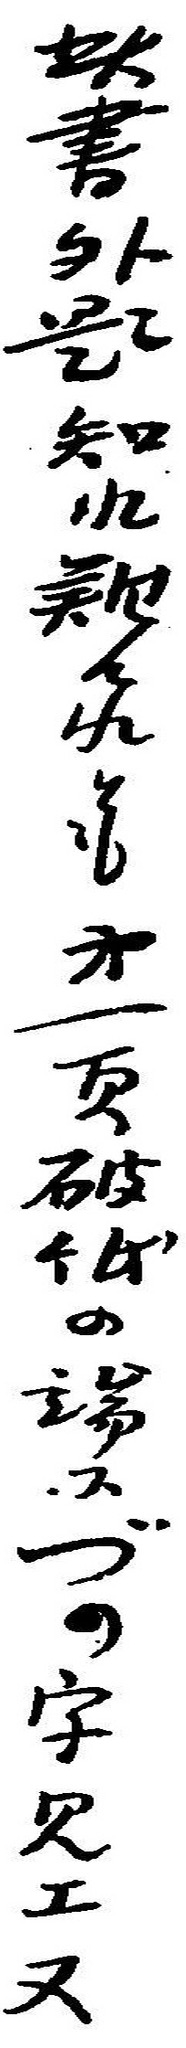此書外題知れ難けれとも第一頁破紙の端にづの字見えぬ
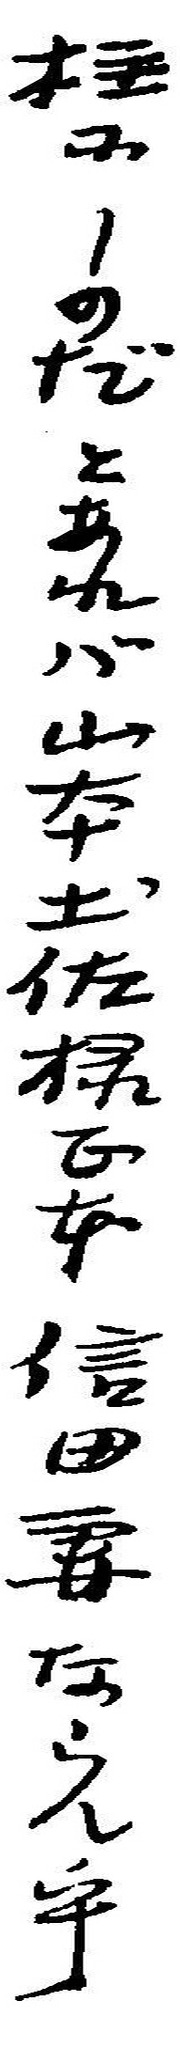柱にしのだとあれば山本土佐様正本信田妻ならん乎
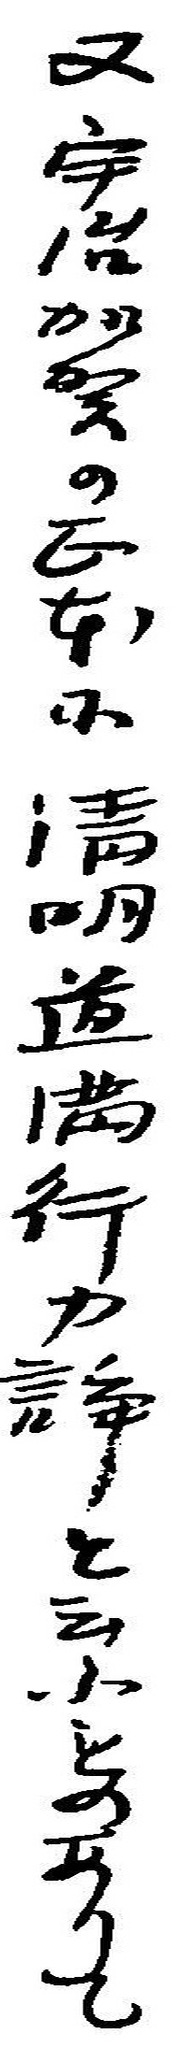又宇治加賀の正本に清明道満行力諍と云ものありて
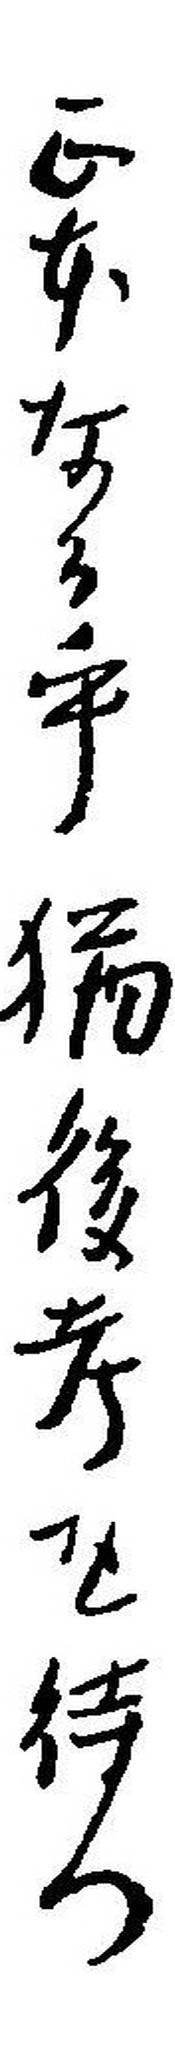正本なる乎猶後考を待つ

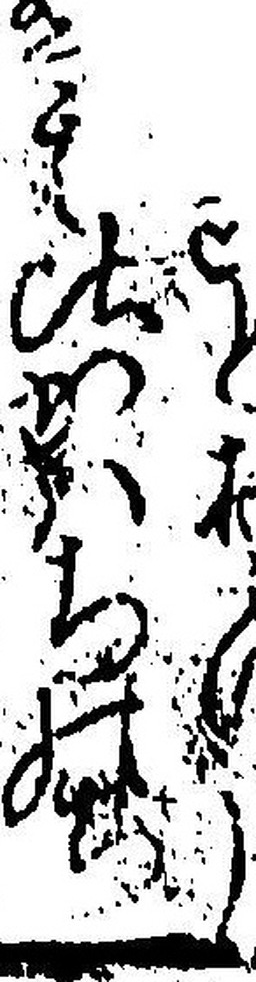其頃かはちのち
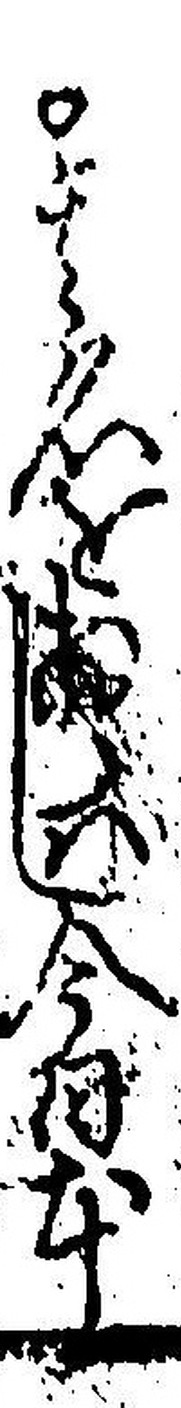其名をあらはし今日本
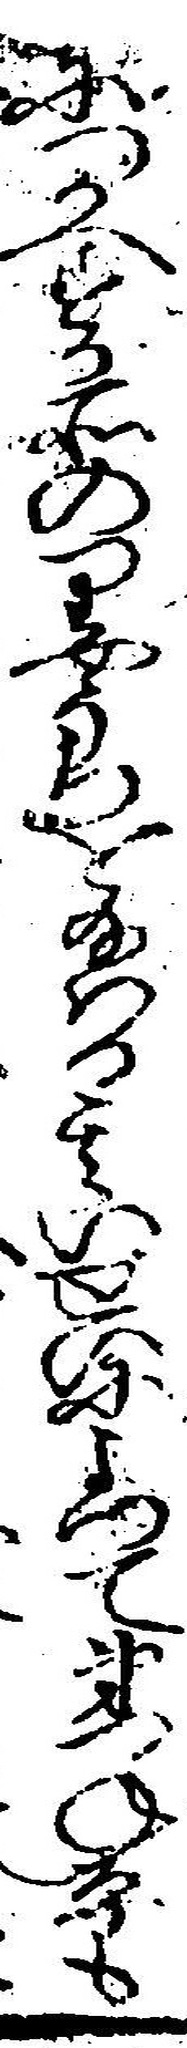か…ふ？つかへする所のりやうちを給はる其いせいによつて弟つね平も
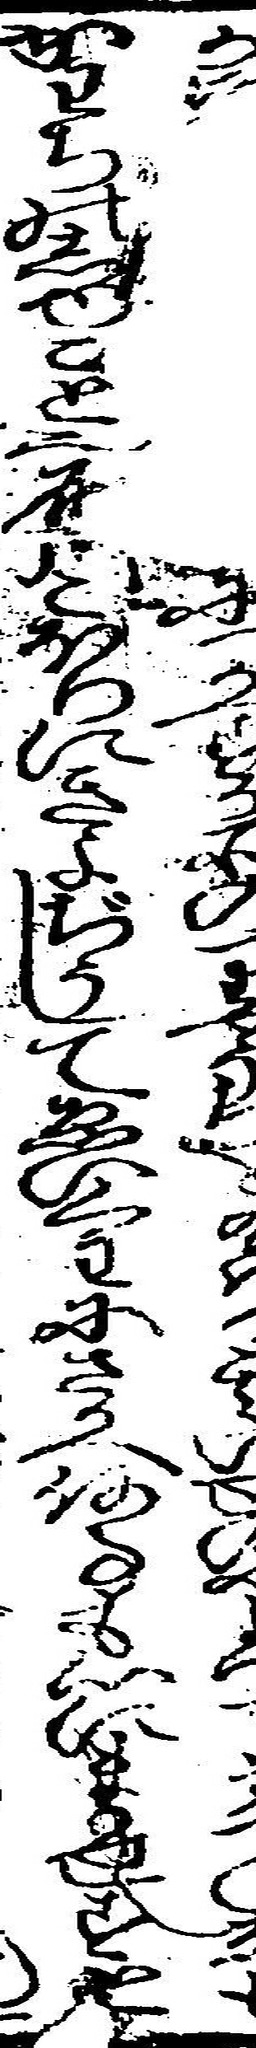かわちのしゆこと也こほりにきよぢうしてゑいくわにさかへあるも心にまかせすと
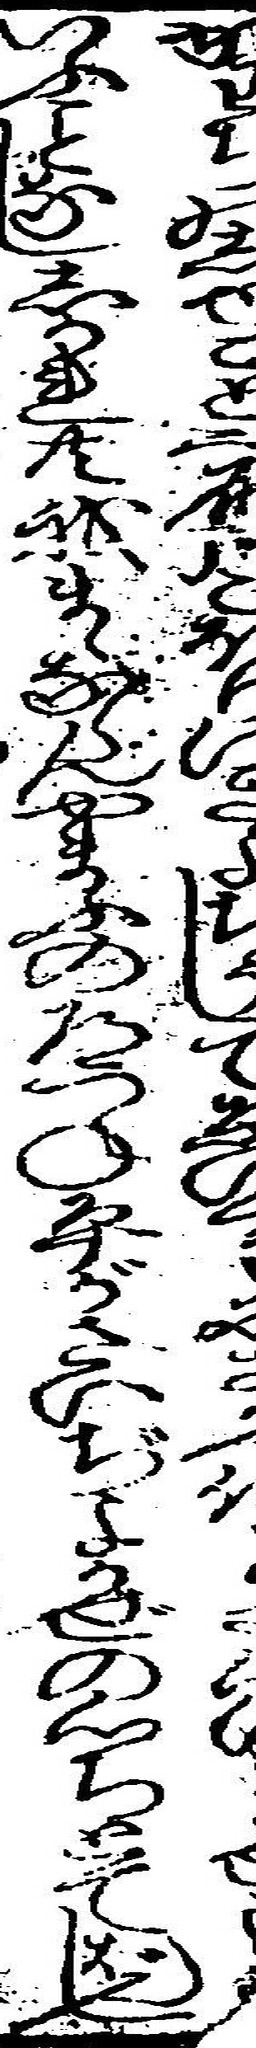いふことなししかれ共我まゝならんやまふの道つね平がさいぢよかぜの心ちとてばんし
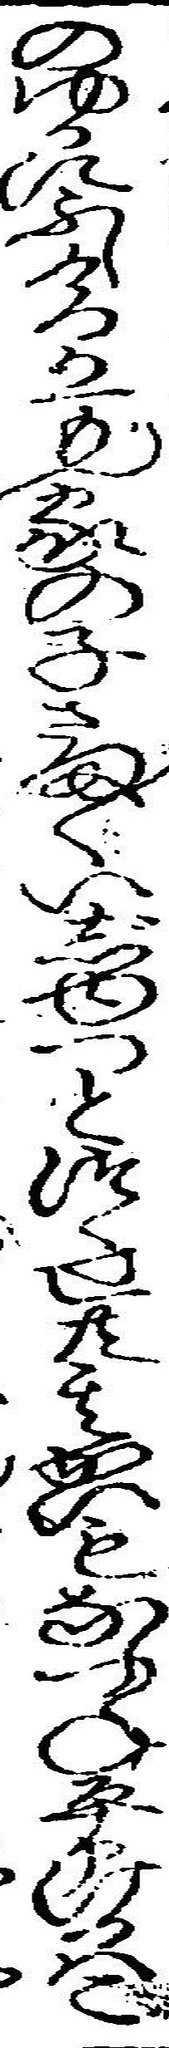のゆかにふしけるか一もん家の子さま〳〵いじゆつとつくせ共其かいもなしつね平申けるはこ
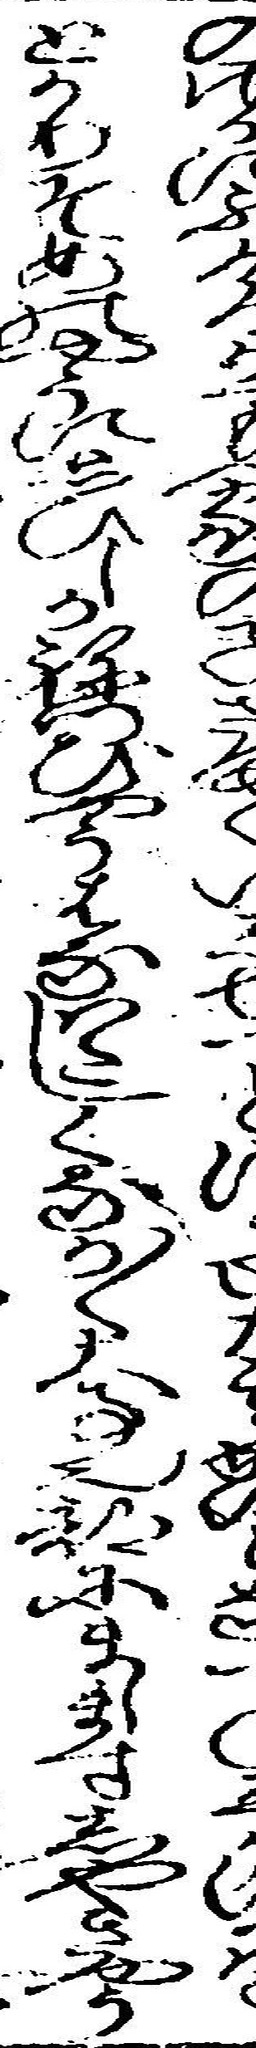とかりそめのやうに思ひしかねつびやうはなはたしくなか〳〵大事也都にましますしやきやう
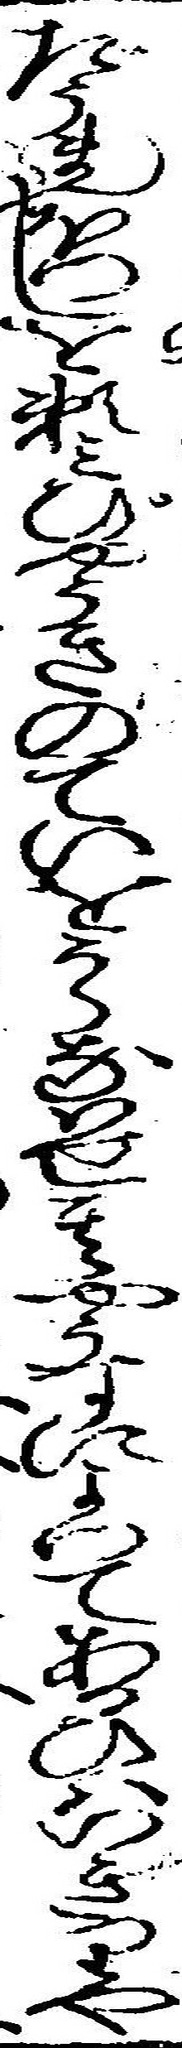だうまんほつしを頼みびやうきのていをうらなはせ其やうすによつてあるひはいきりや
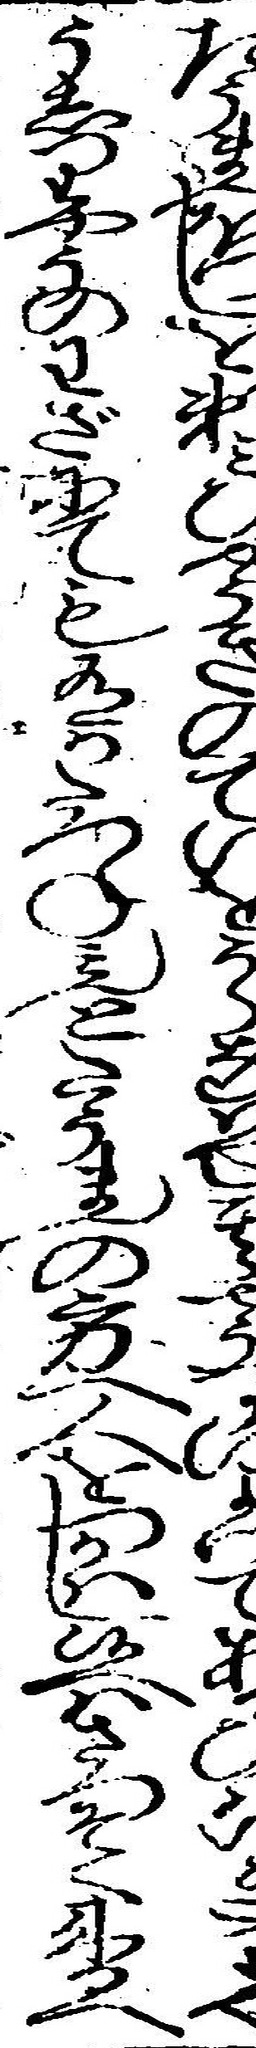うしりやうのわざにても有かたつねみんとたうまんの方へ人をつかはし候へはさつそく来るへ
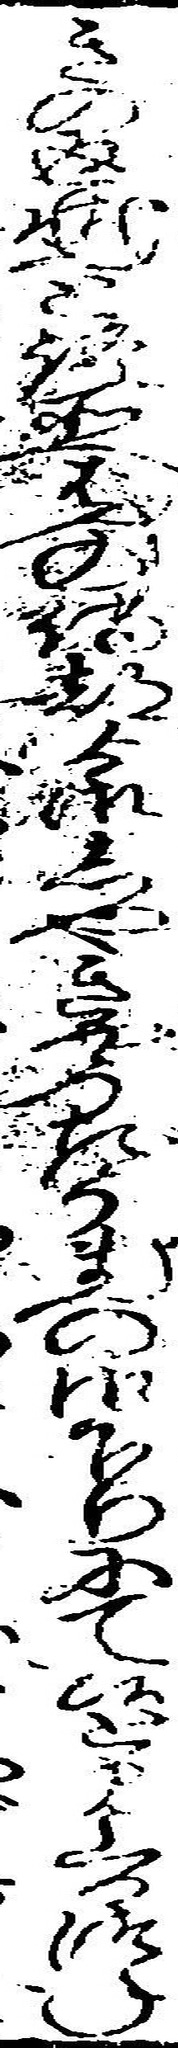きの返状也と語？所へはんの物都ゟ御しやきやうだうまんの御下りにて候と申上るつね
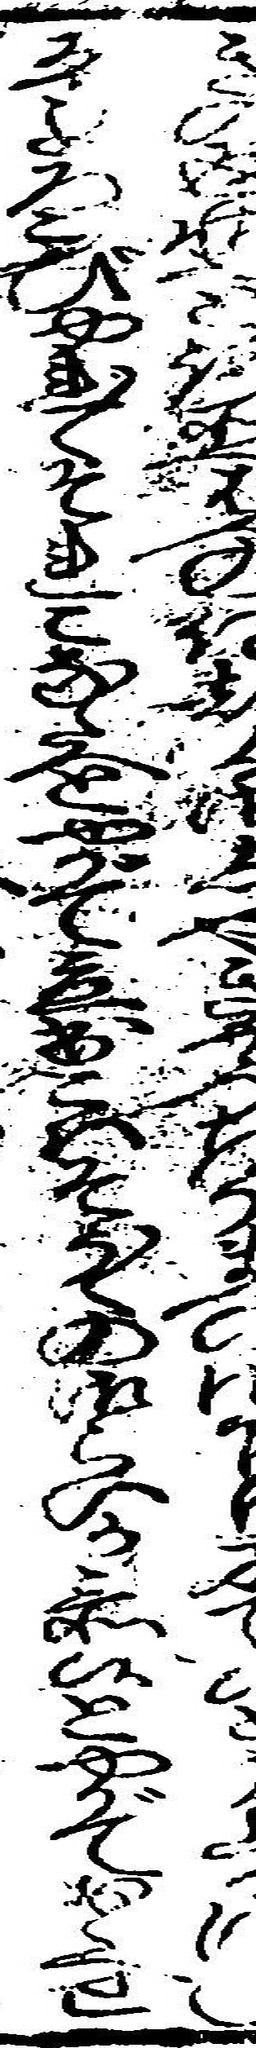平よろこびやれ〳〵それこなたへとやがて立出こはそう〳〵の御らいか忝候とやがておくへせ
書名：[しのだづまつりぎつね付あべの清明出生]
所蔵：東京大学総合図書館 General Library in the University of Tokyo, JAPAN
